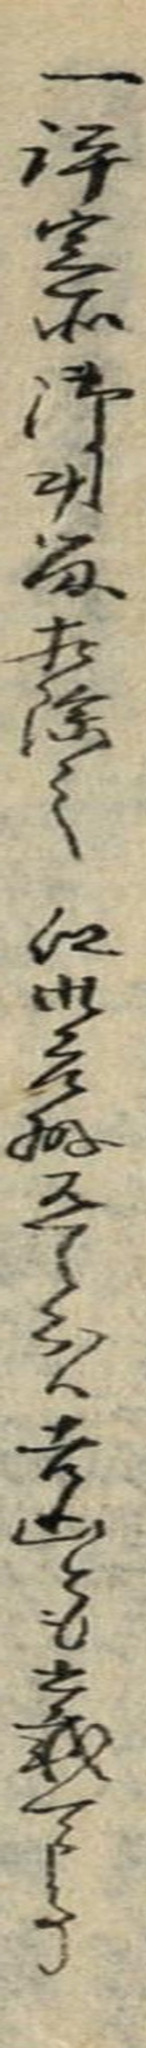一評定所御用留相除之但御取扱有之分は吉凶とも書載可申事
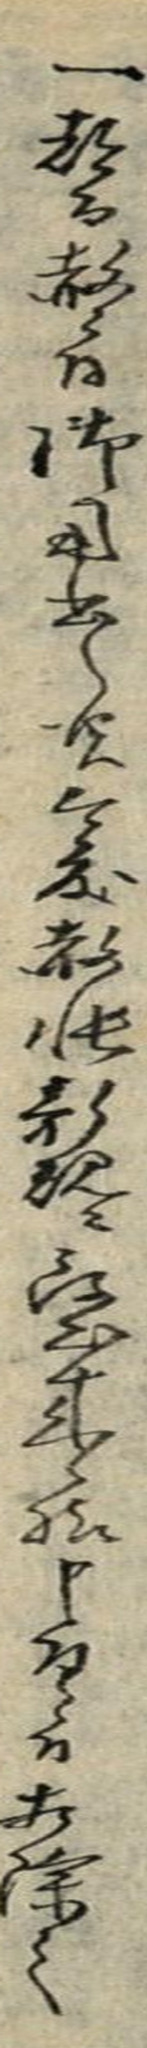一都而赦候付御用書之儀は今度赦帳新規に致出来候様申付候に付相除之
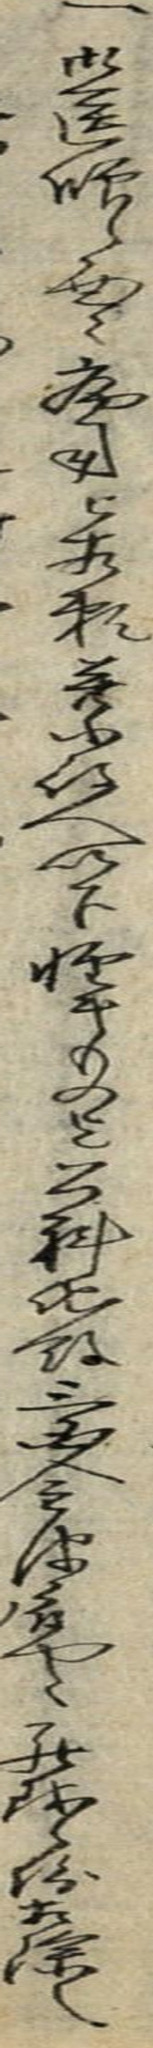一御医師之面々病用被相頼并小役人以下軽きもの迄公料他領三国金津府中へ罷越候儀相除之
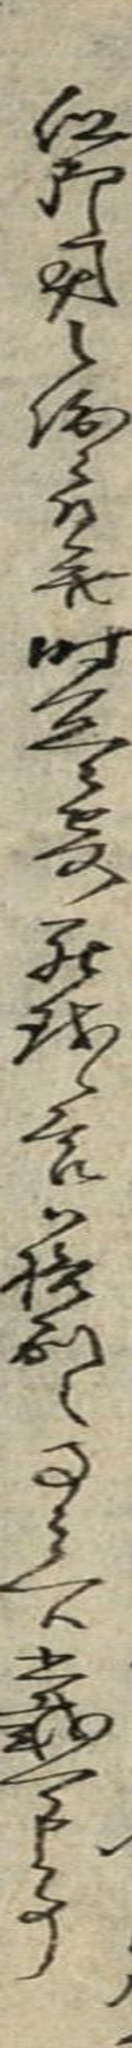但御用之儀に付候共時宜に寄罷越候節は格別之事に候へは書載可申事
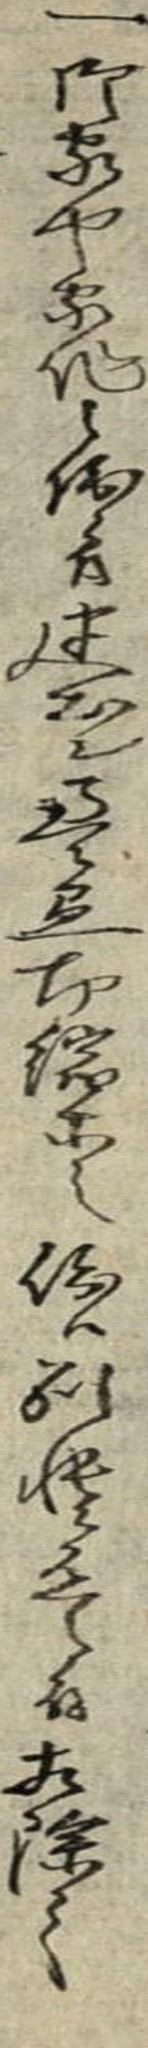一御家中家作之儀に付建出し畳置切縮等之儀は別帳に有之候付相除之
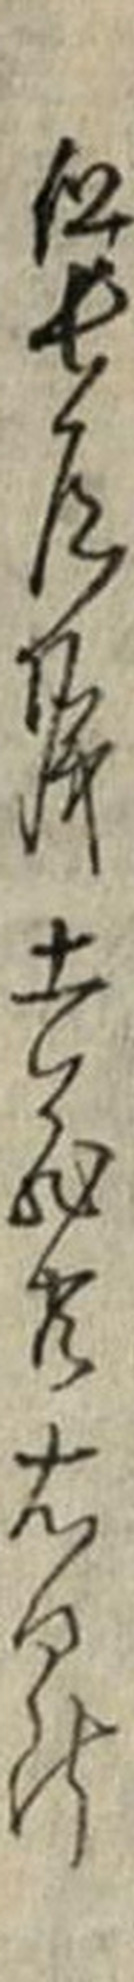但長屋塀土蔵共右同断
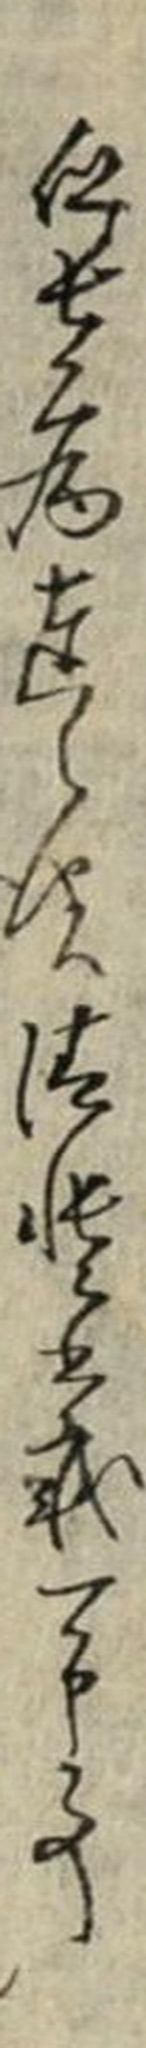但長病達候儀は請帳に書載可申事
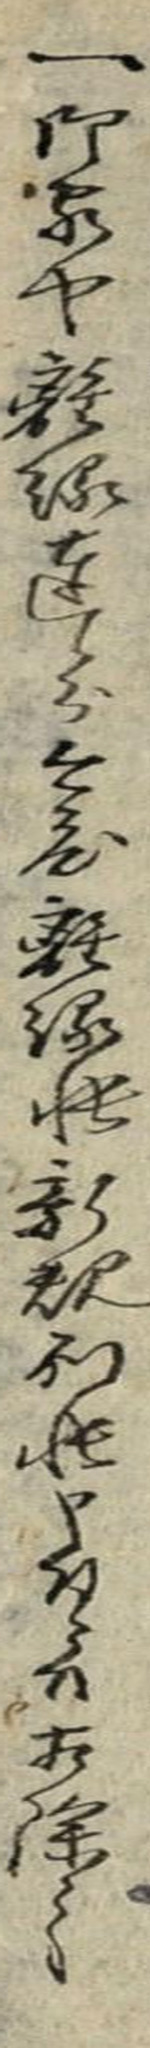一御家中離縁達候分今度離縁帳新規別帳申付候付相除之
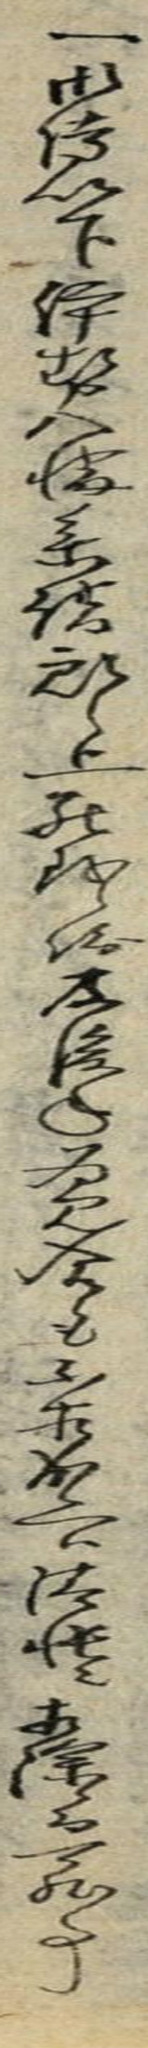一御侍以下伊勢八幡参詣願候上罷越候儀及後年為見合にも不相成候へは請帳に相除候而可然事
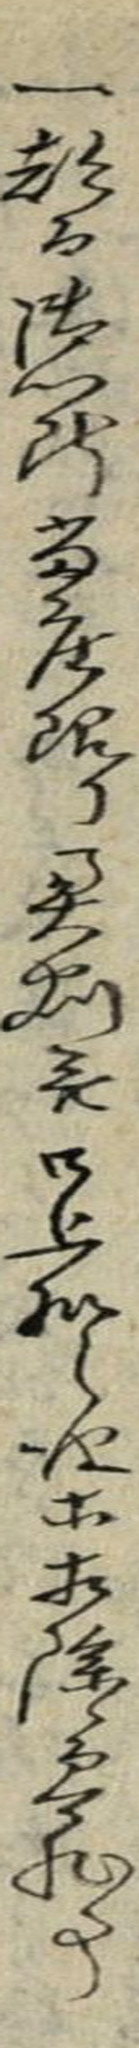一都而御門断当座限り奥判并口上扣之儀等相除候而可然事
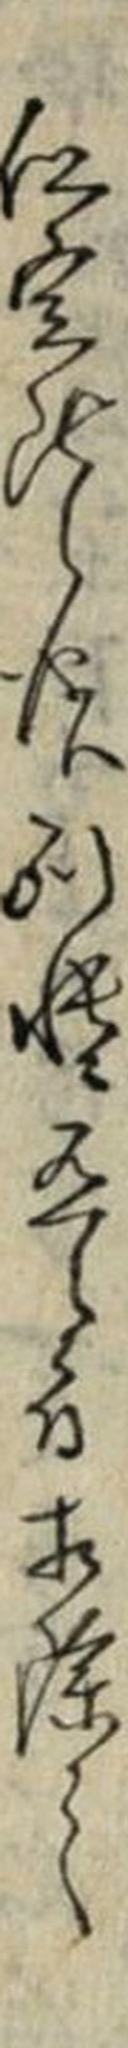但定断之儀は別帳に有之候付相除之
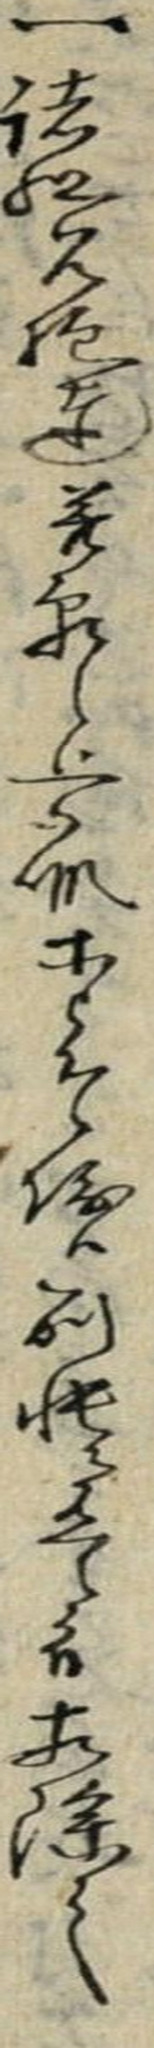一諸組召抱達并願之上御暇等被下候儀は別帳有之候付相除之
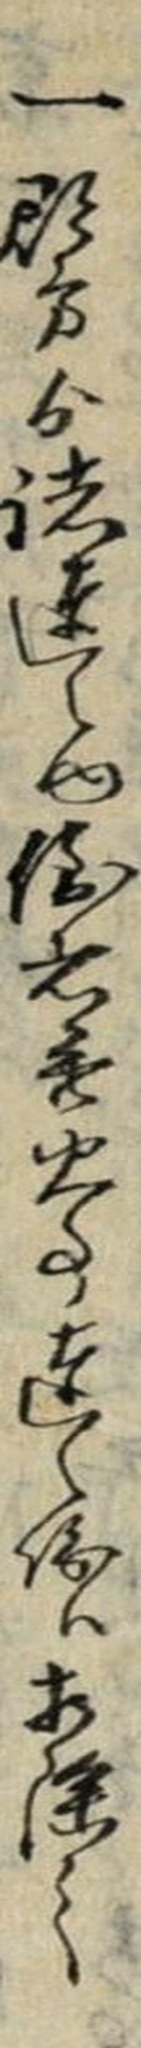一郡方ゟ諸達之内倒者并火事達之儀は相除之
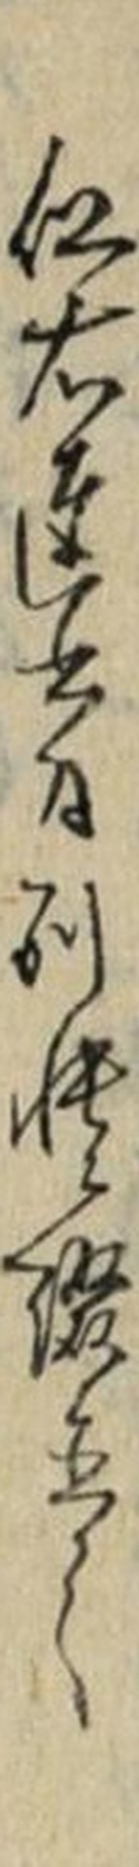但右達書付別帳に綴有之
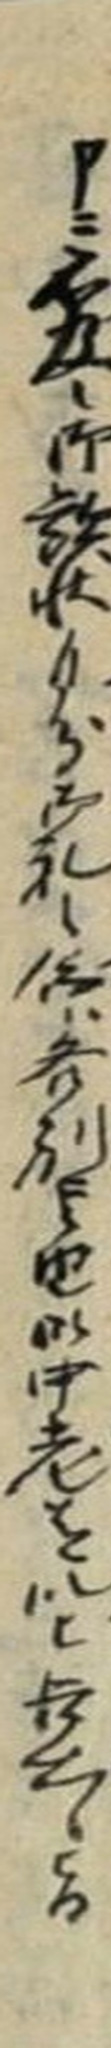申に不及御歓状自分御礼之儀は各別申由御中老を以被仰出候旨
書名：蒐輯之部
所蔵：福井県文書館 Fukui Prefectural Archives
